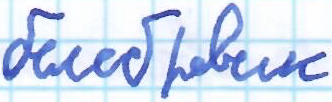белобровик
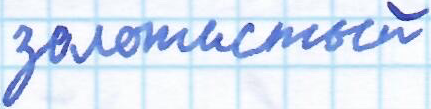золотистый
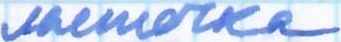ласточка
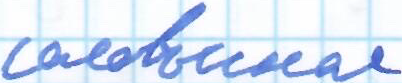соловьиная
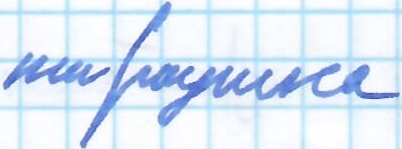тиркушка
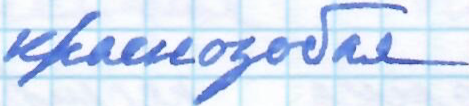краснозобая
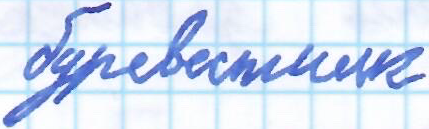буревестник
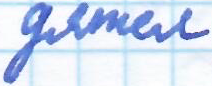дятел
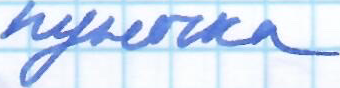пуночка
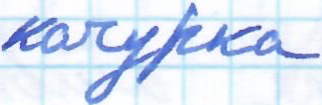качурка
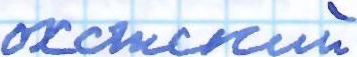охотский
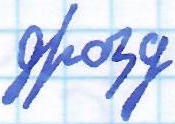дрозд
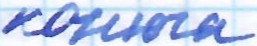конюга
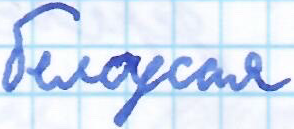белоусая
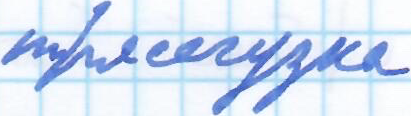трясогузка
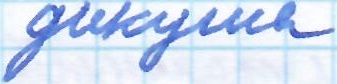дикуша
